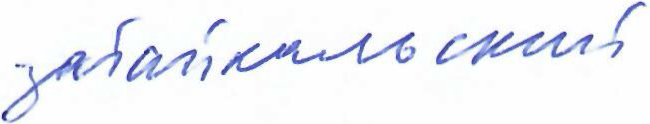забайкальский
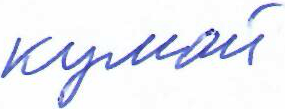кумай
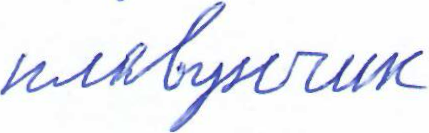плавунчик
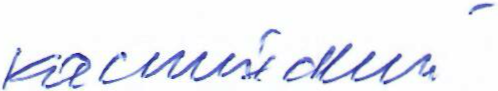каспийский
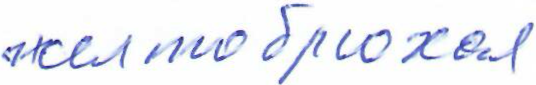желтобрюхая
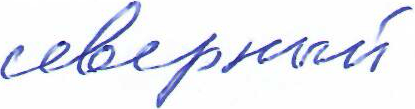северный
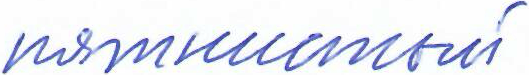пятнистый
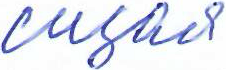сизая
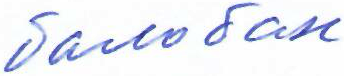балобан
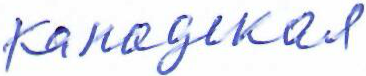канадская
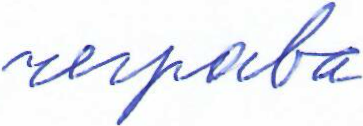чеграва
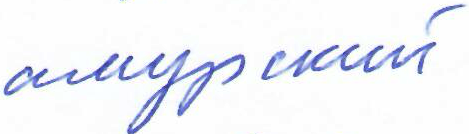амурский
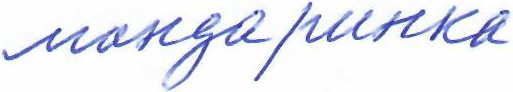мандаринка
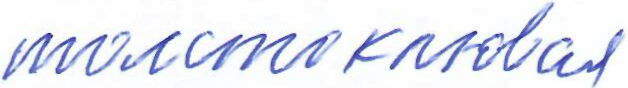толстоклювая
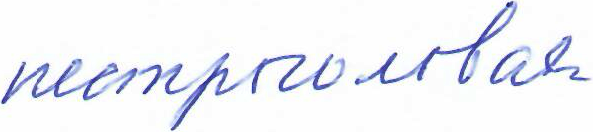пестроголовая
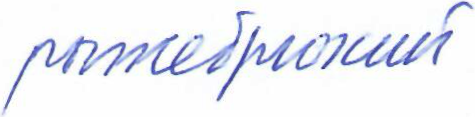рыжебрюхий
